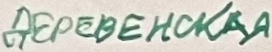деревенская
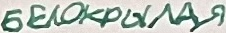белокрылая
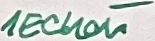лесной
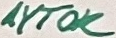луток
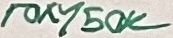голубок
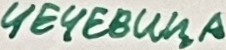чечевица
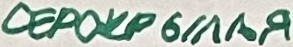серокрылая
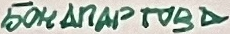бонапартова
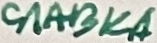славка
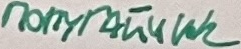попугайчик
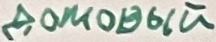домовый
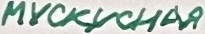мускусная
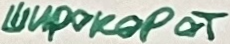широкорот
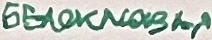белоклювая
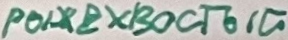рыжехвостый
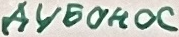дубонос
